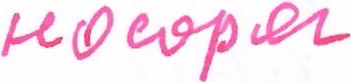носорог
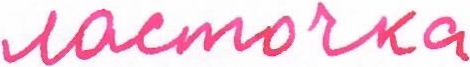ласточка
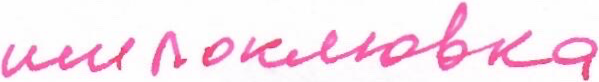шилоклювка
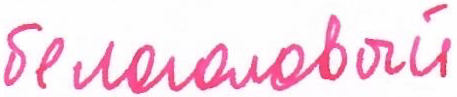белоголовый
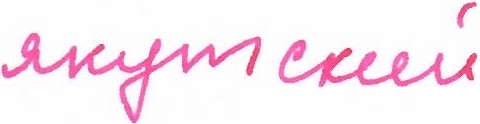якутский
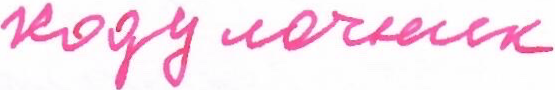ходулочник
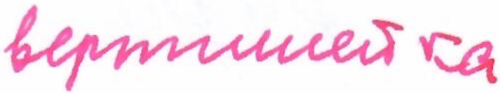вертишей ка
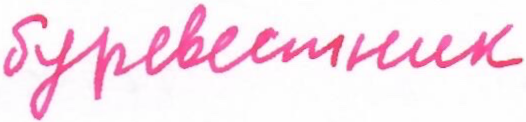буревестник
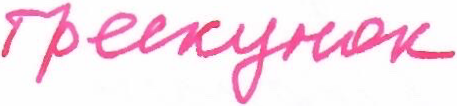трескунок
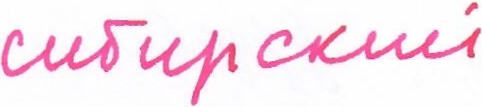сибирский
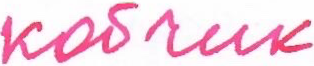кобчик
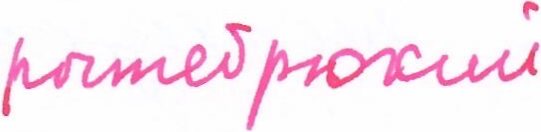рыжебрюхий
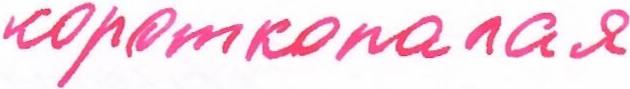короткопалая
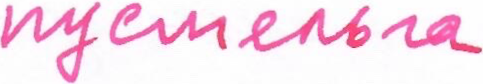пустельга
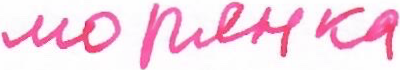морянка
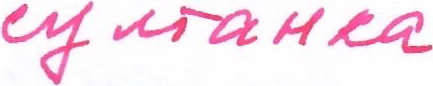султанка
